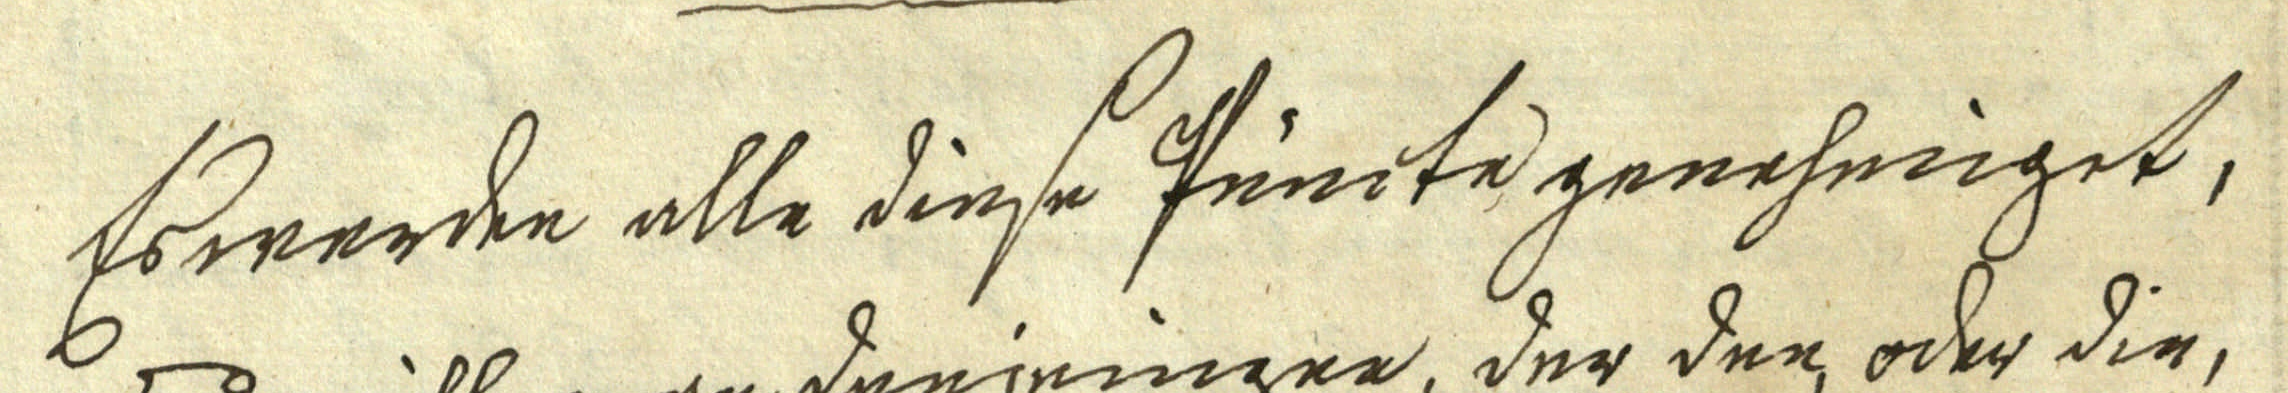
Es werden alle diese Puncte genehmiget,
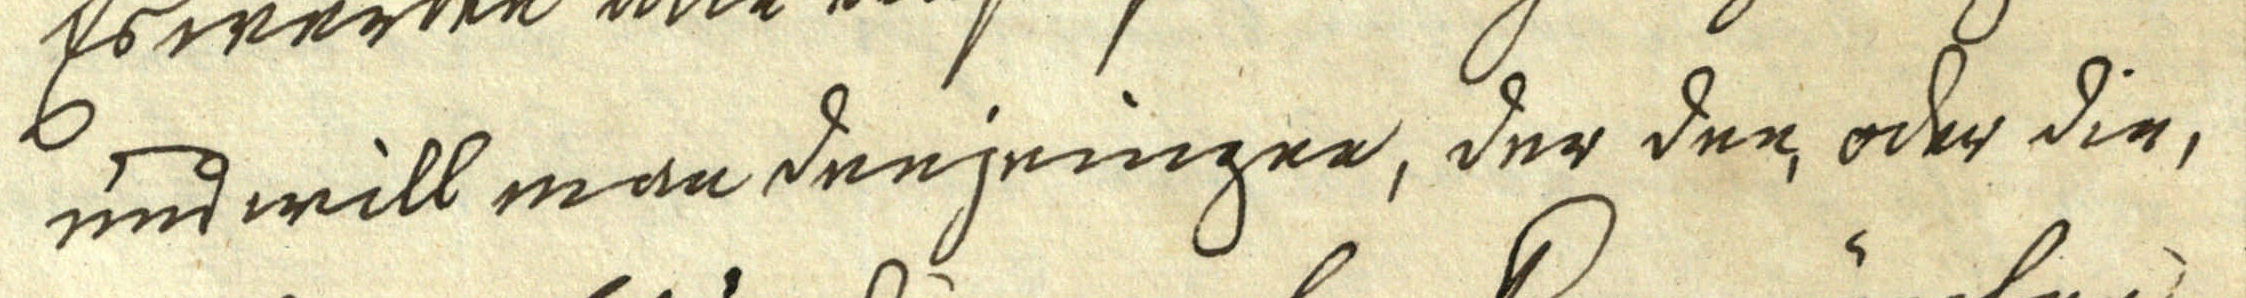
und will man denjenigen, der den, oder die,
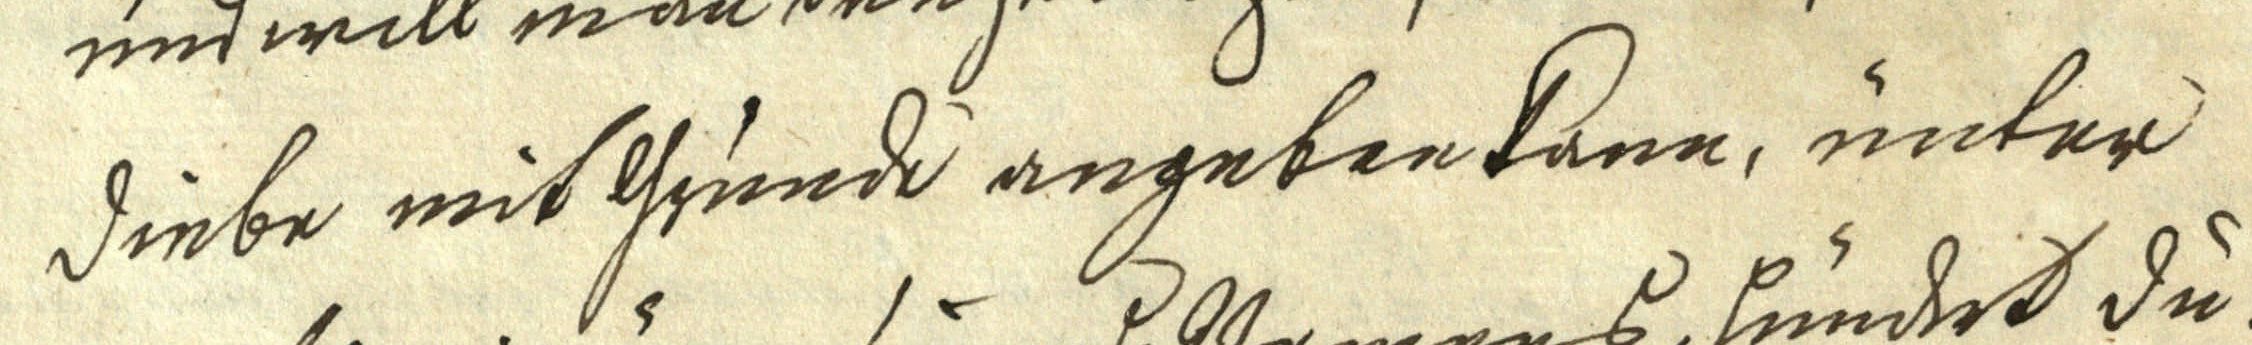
Diebe mit Grunde angeben kann, unter
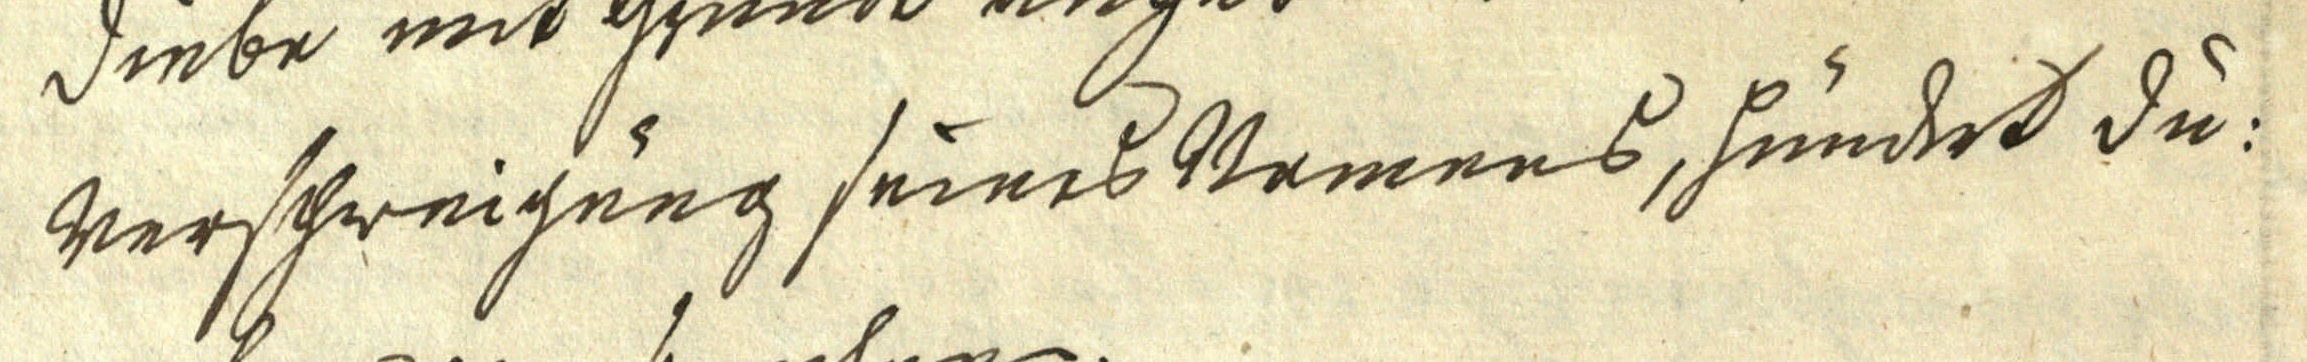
Verschweigung seines Namens, hundert Du¬
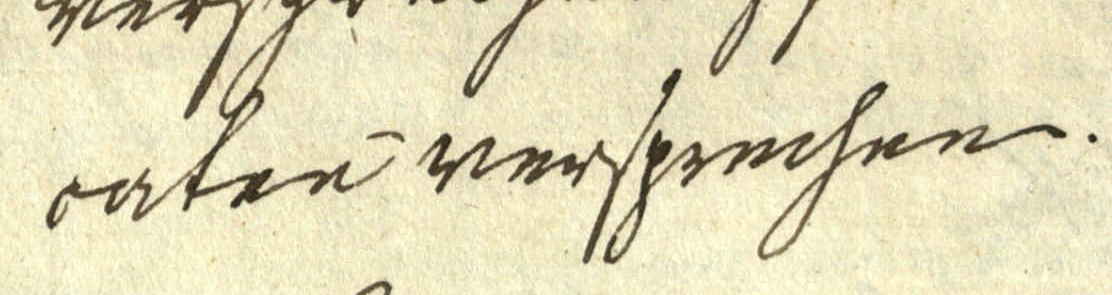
caten versprechen.
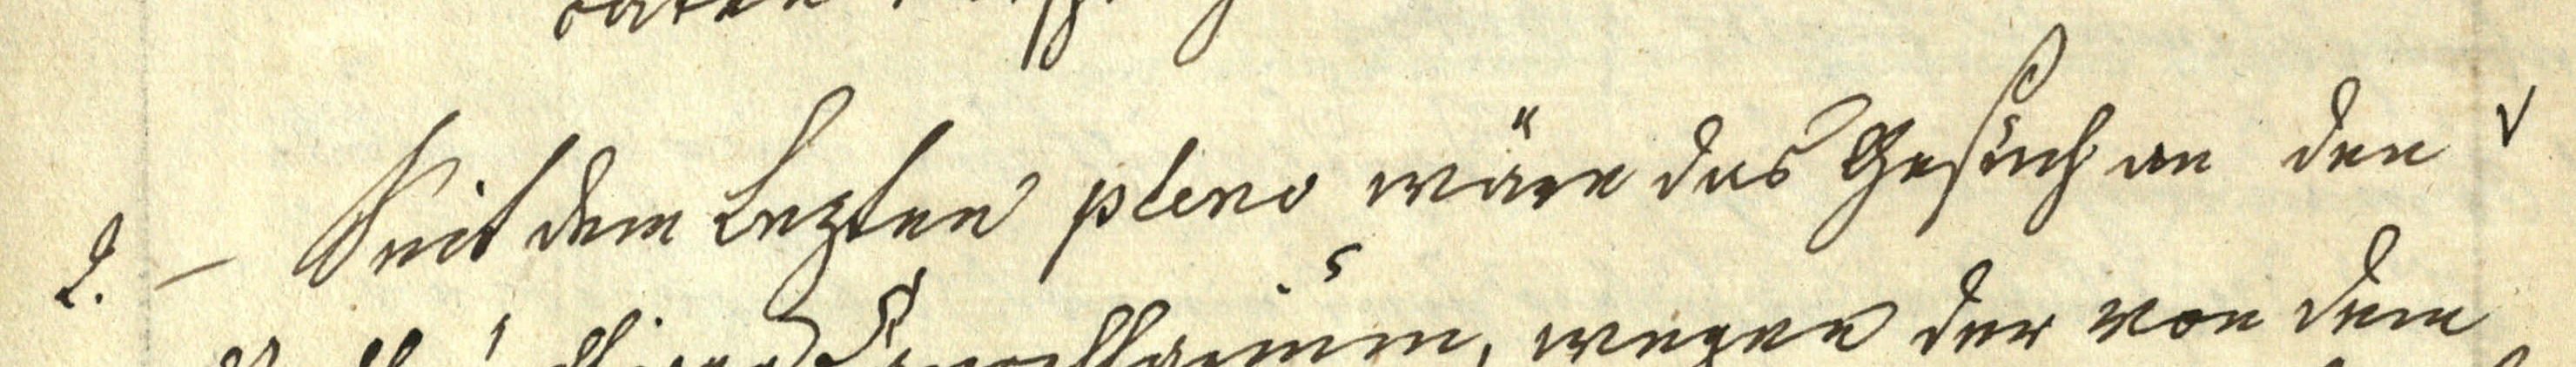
2. Seit dem lezten pleno wäre das Gesuch an den
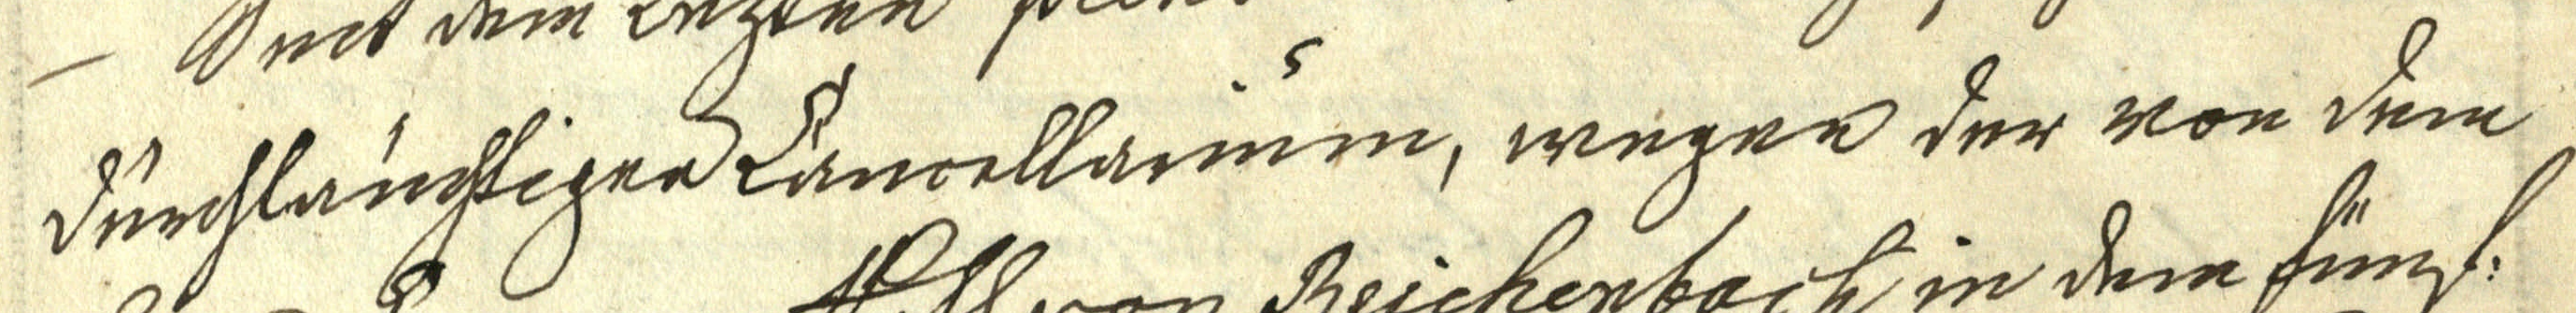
Durchlauchtigen Cancellarium, wegen der von dem
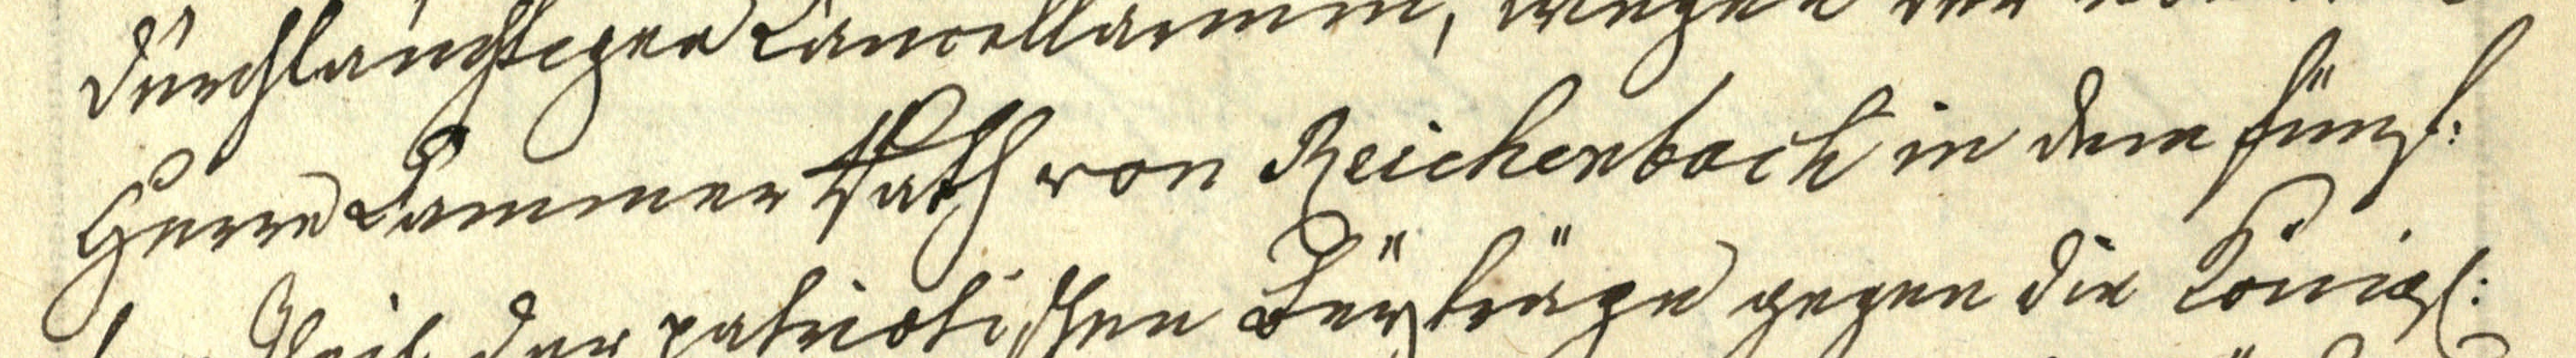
Herrn CammerRath von Reichenbach in dem fünf¬
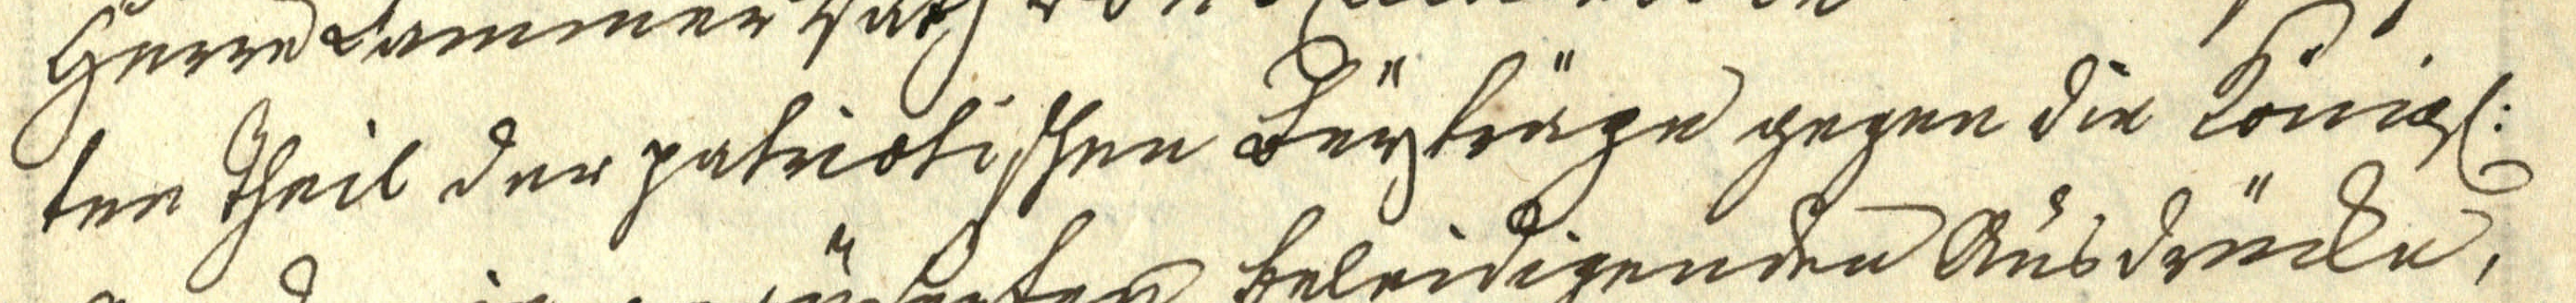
ten Theil der patriotischen Beÿträge gegen die Königl.
